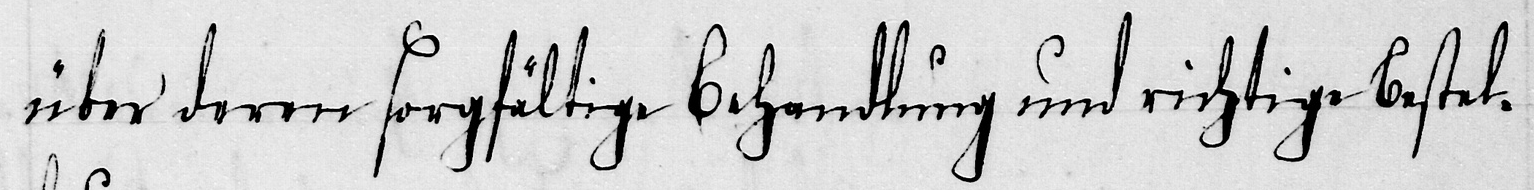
über deren sorgfältige Behandlung und richtige Beste¬
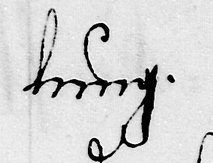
llung.
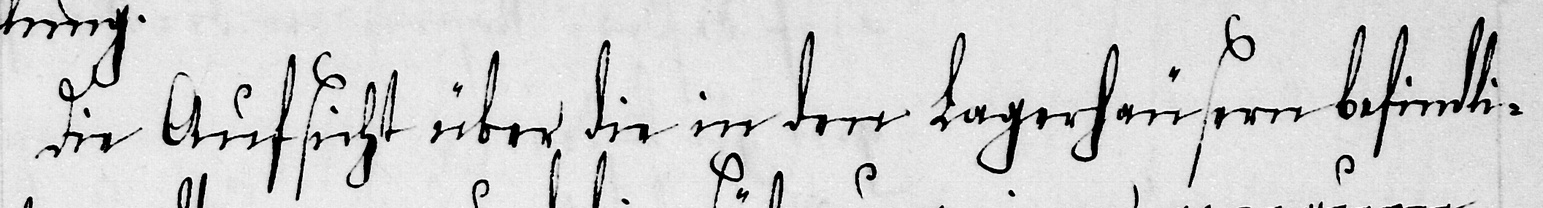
Die Aufsicht über die in den Lagerhäusern befindli¬
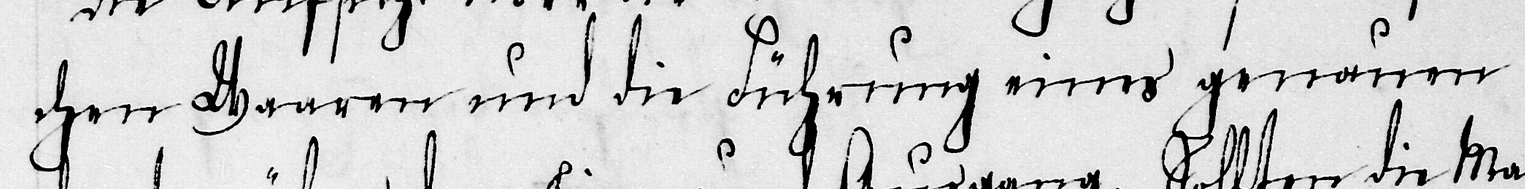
chen Waaren und die Führung eines genauen
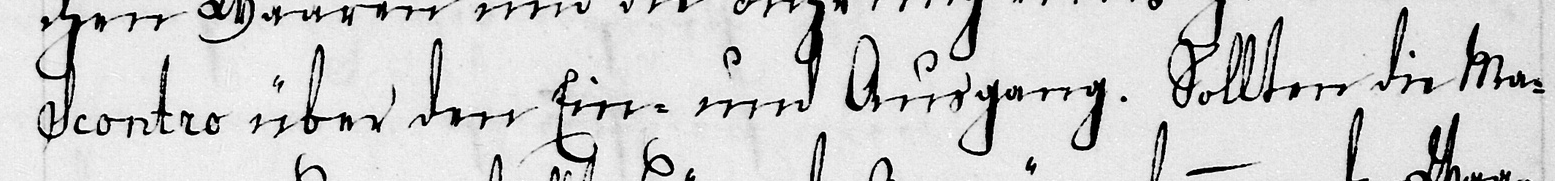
Scontro über den Ein- und Ausgang. Sollten die Ma¬
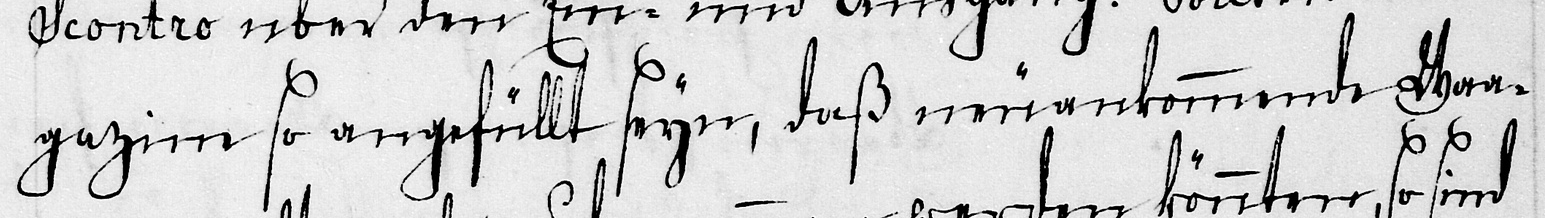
gazine so angefüllt seyn, daß neuankommende Waa¬
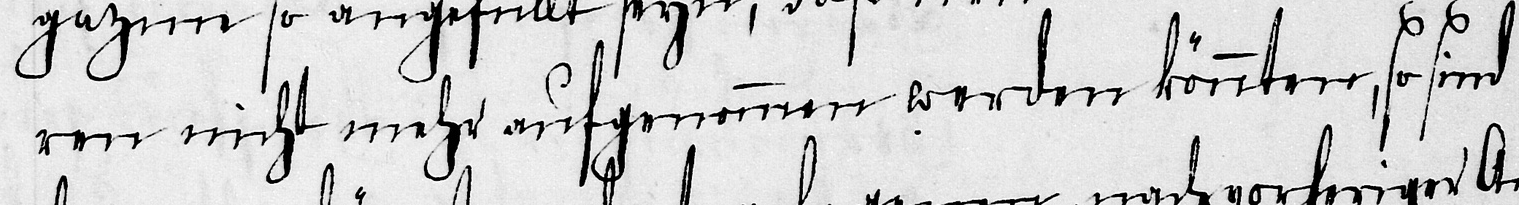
ren nicht mehr aufgenommen werden könnten, so sind
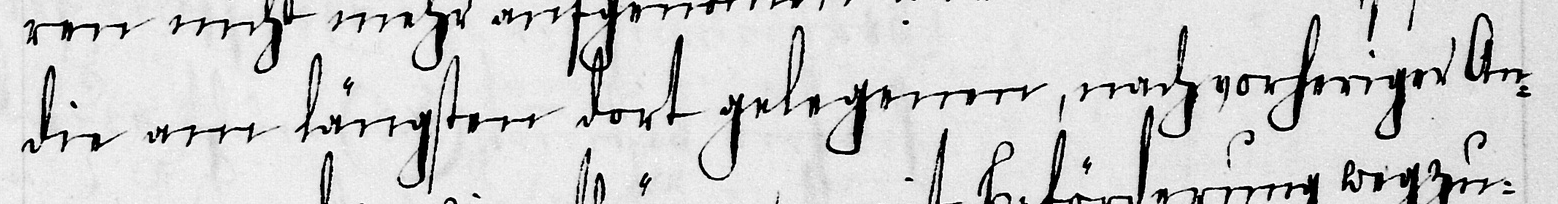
die am längsten dort gelegenen, nach vorheriger An¬
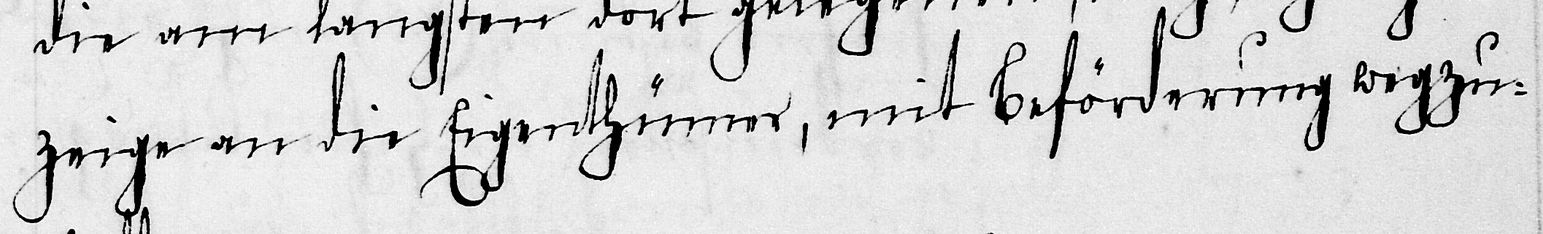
zeige an die Eigenthümer, mit Beförderung wegzu¬
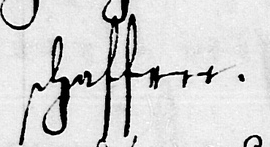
schaffen.
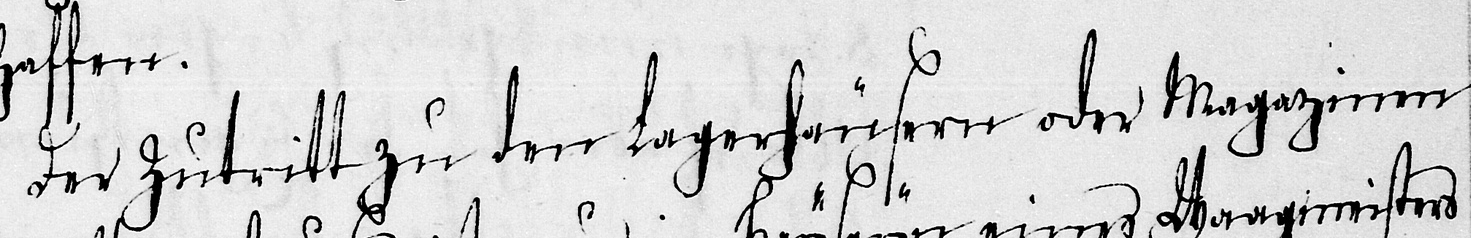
Der Zutritt zu den Lagerhäusern oder Magazinen
